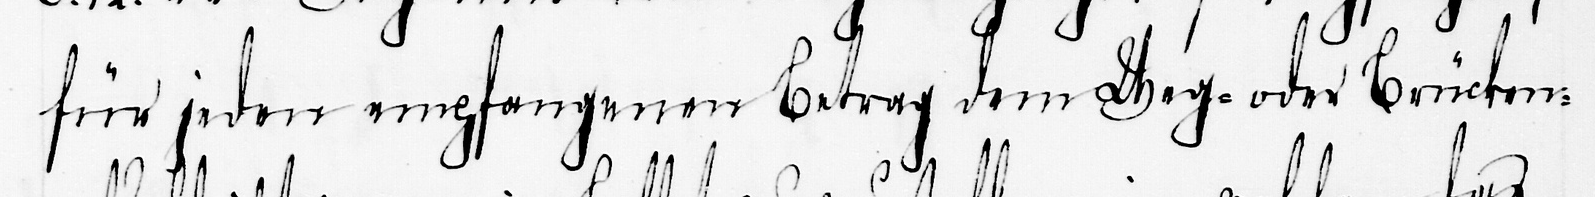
für jeden empfangenen Betrag den Weg- oder Brücken¬
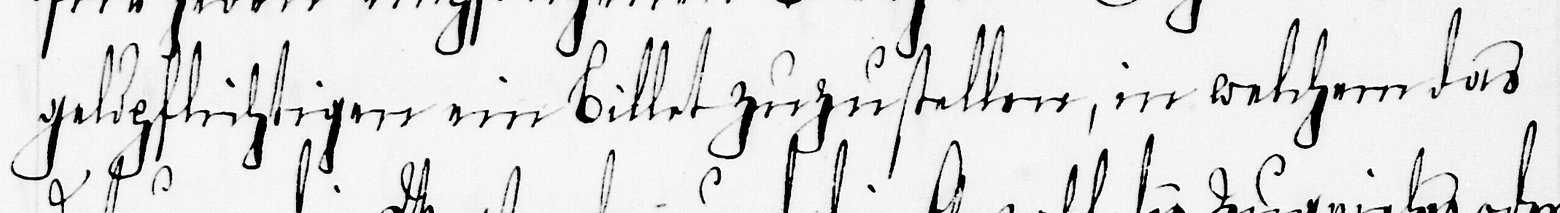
geldpflichtigen ein Billet zuzustellen, in welchem das
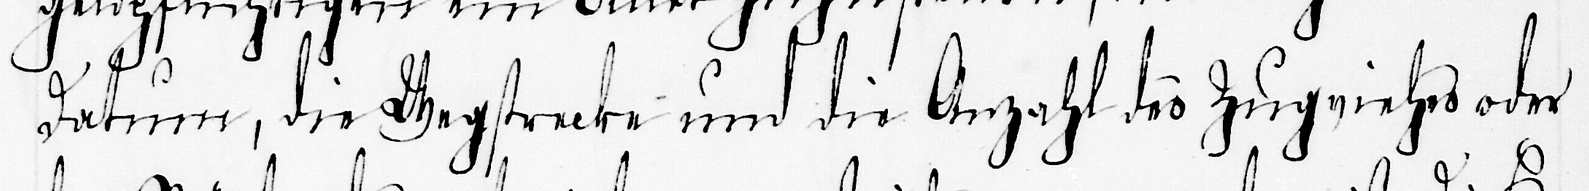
Datum, die Wegstrecke und die Anzahl des Zugviehes oder
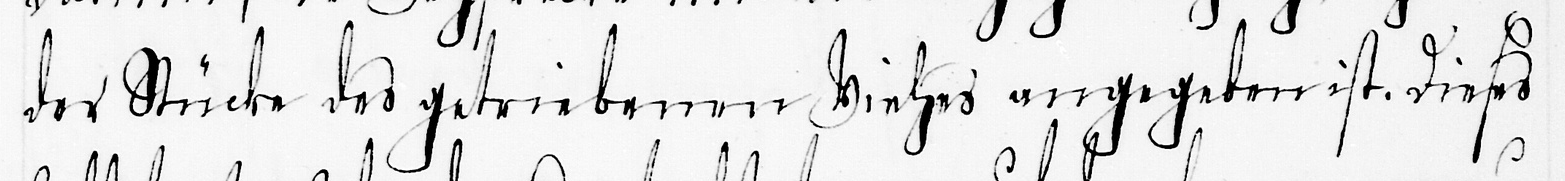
der Stücke des getriebenen Viehes angegeben ist. Dieses
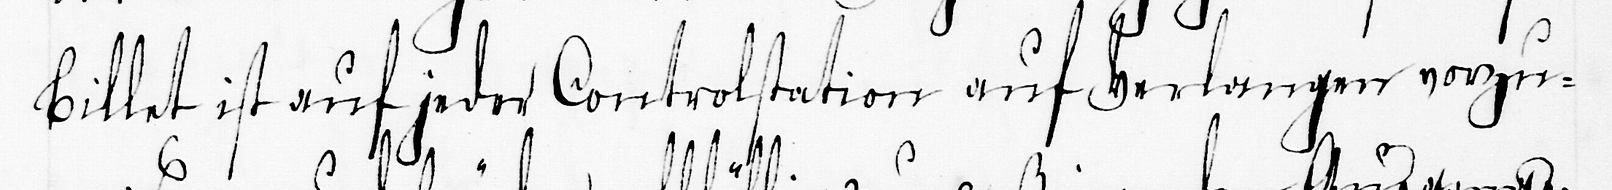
Billet ist auf jeder Controlstation auf Verlangen vorzu¬
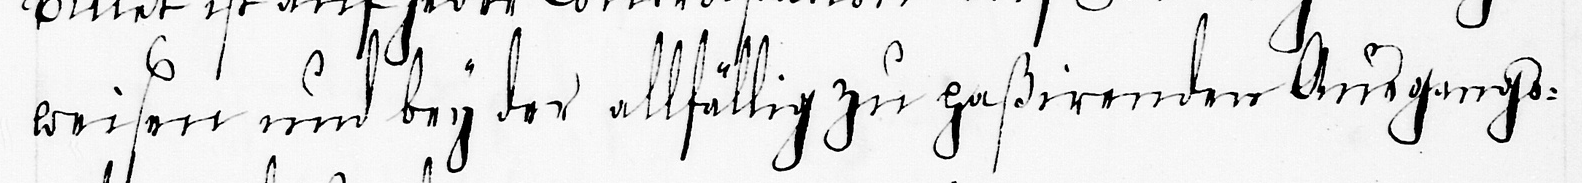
weisen und bey der allfällig zu paßirenden Ausgangs¬
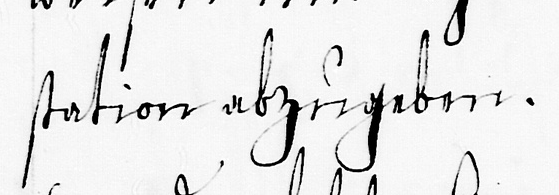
station abzugeben.
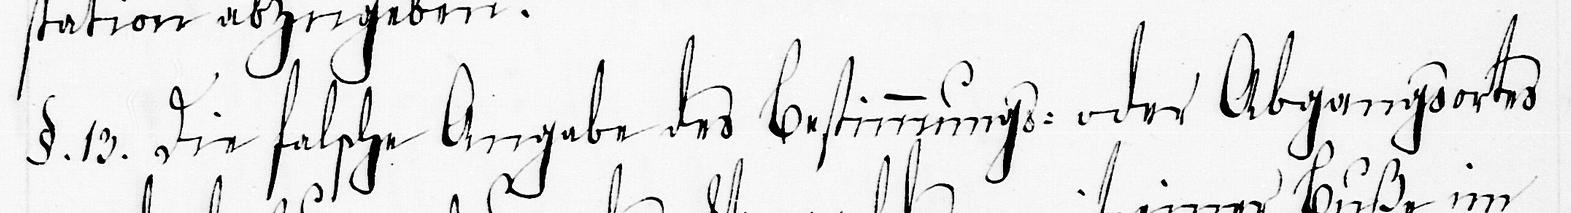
§. 13. Die falsche Angabe des Bestimmungs- oder Abgangsortes
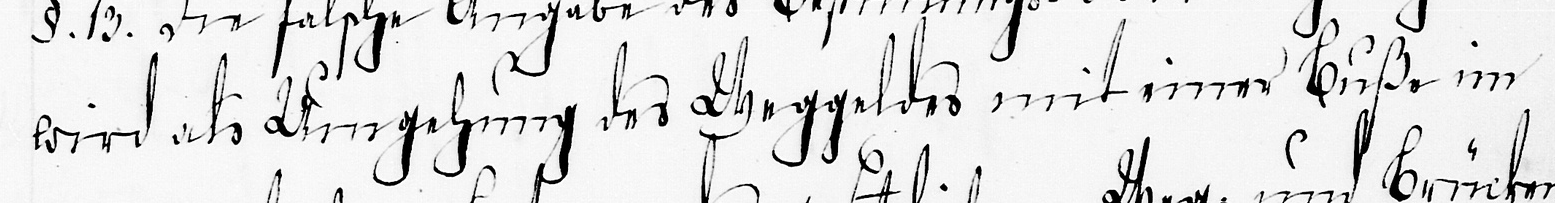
wird als Umgehung des Weggeldes mit einer Buße im
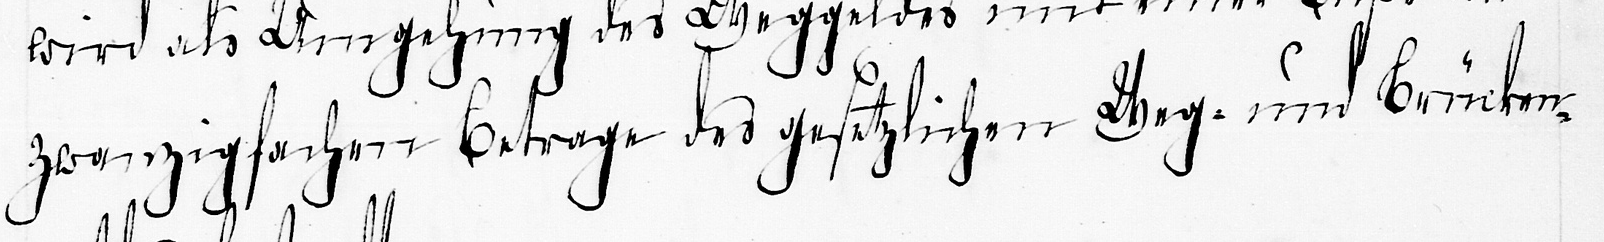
zwanzigfachen Betrage des gesetzlichen Weg- und Brücken¬
